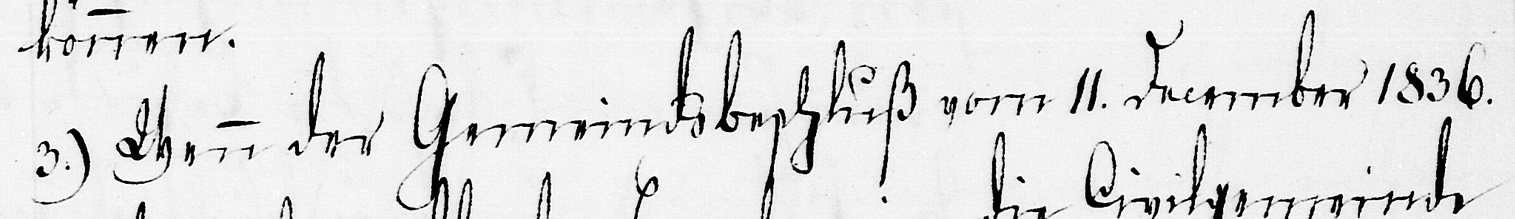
3.) Wenn der Gemeindsbeschluß vom 11. December 1836.
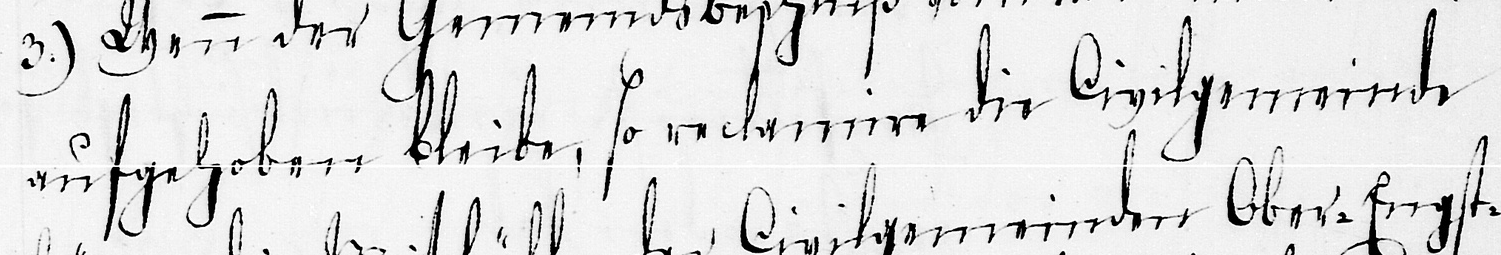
aufgehoben bleibe, so reclamire die Civilgemeinde
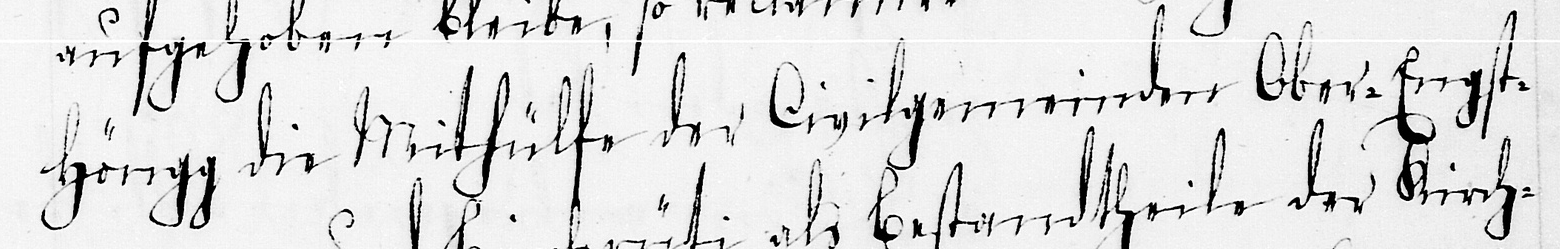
Höngg die Mithülfe der Civilgemeinden Ober-Engst¬
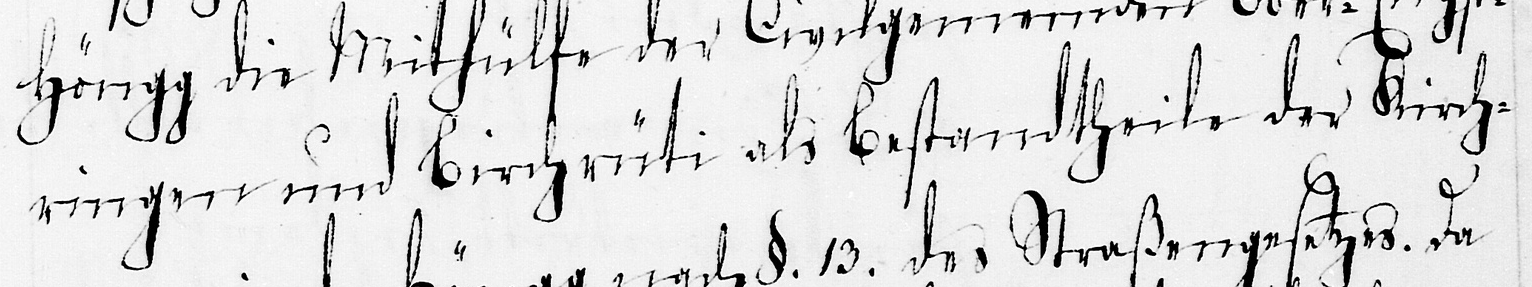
ringen und Birchrüti als Bestandtheile der Kirch¬
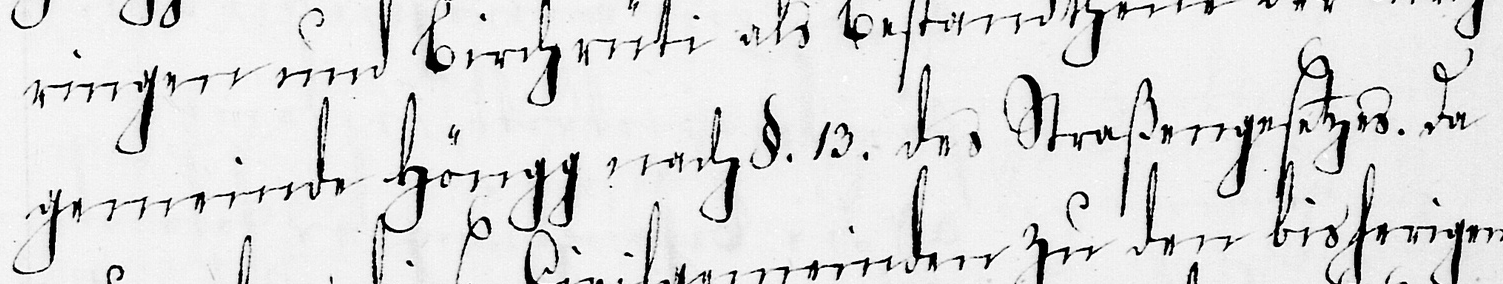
gemeinde Höngg nach §. 13. des Straßengesetzes. Da
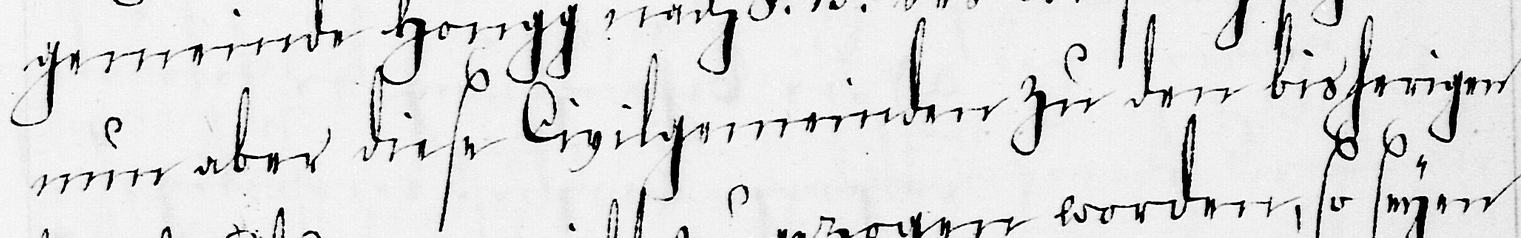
nun aber diese Civilgemeinden zu den bisherigen
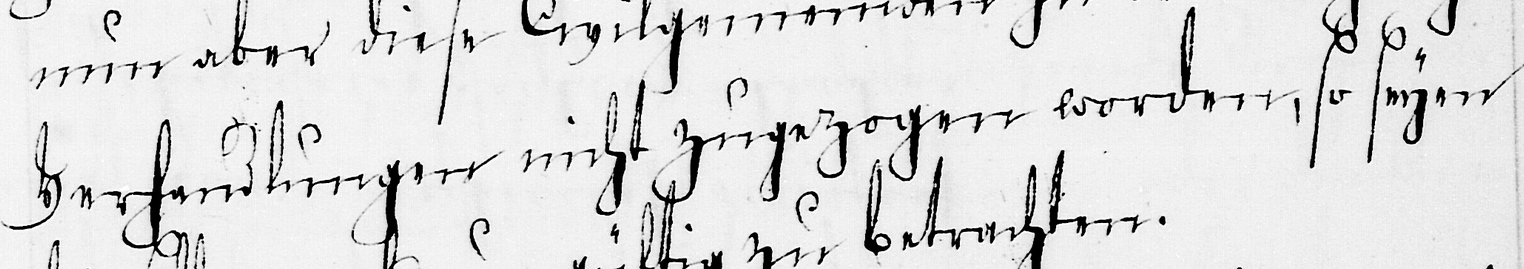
Verhandlungen nicht zugezogen worden, so seyen
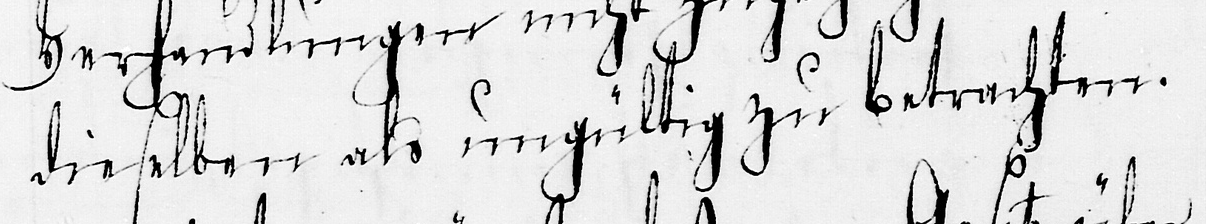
dieselben als ungültig zu betrachten.
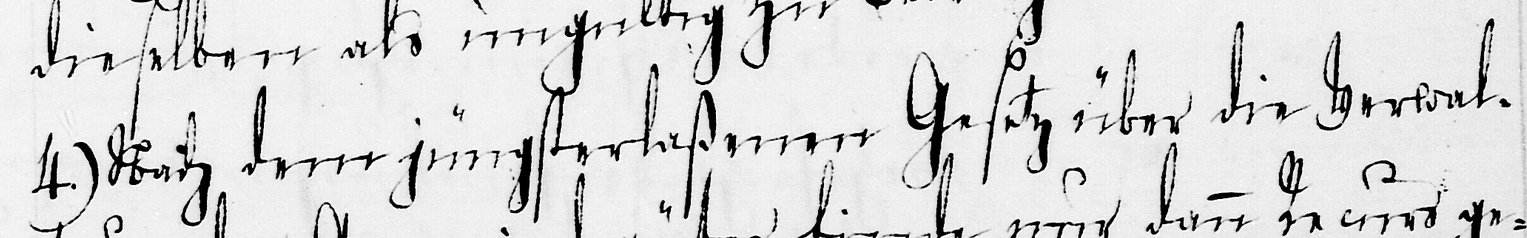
4.) Nach dem jüngsterlaßenen Gesetz über die Verwal¬
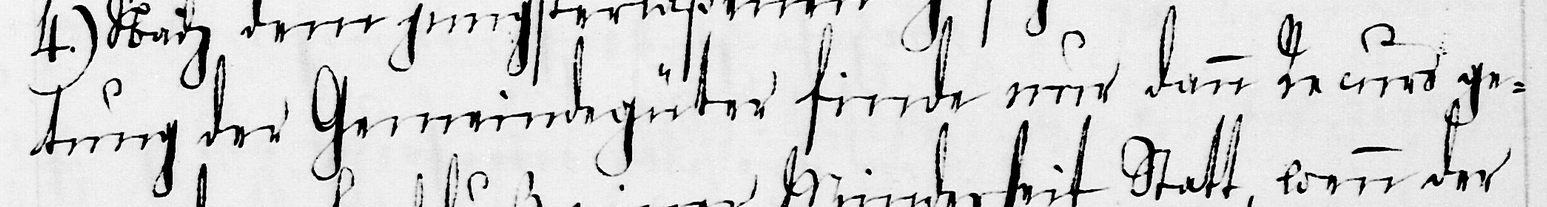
tung der Gemeindegüter finde nur dann Recurs ge¬
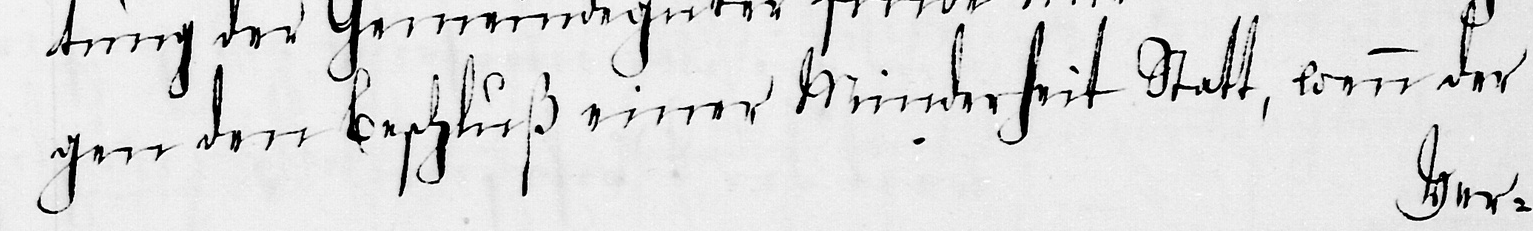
gen den Beschluß einer Minderheit Statt, wenn der
